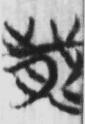歲
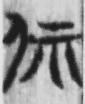𫵖
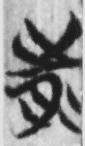之月
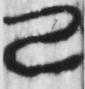己
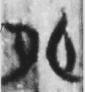卯
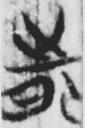之月
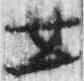五
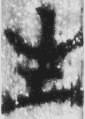生
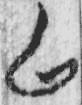㠯（以）
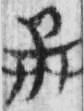丞
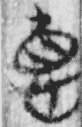惪
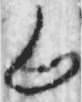㠯（以）
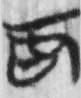爲
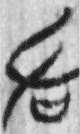左
